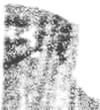亓（其）
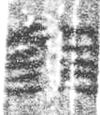金
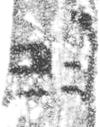玉
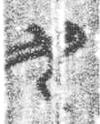民
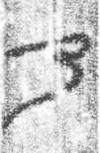乃
